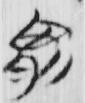{胃刀}（謂）
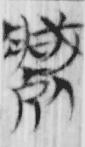○（葬）
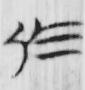於
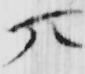亓（其）
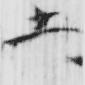土
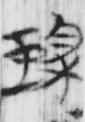○（瑶）
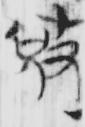敓
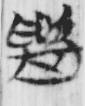○（舉）
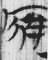雁
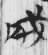成
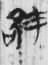唯
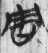周
